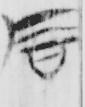石
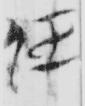佢
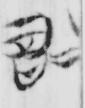訟
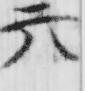亓（其）
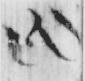州
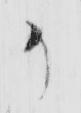人
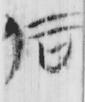冶
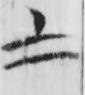士
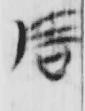石
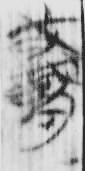○（脖）
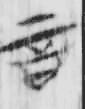言
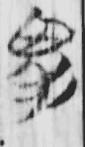{胃刀}（謂）
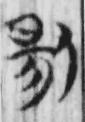傷
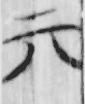亓（其）
